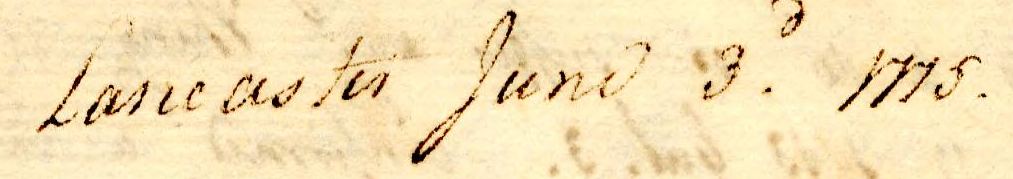Lancaster June 3^d. 1775
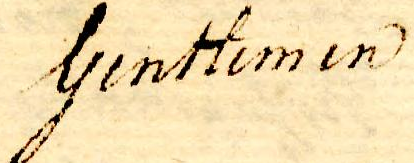Gentlemen
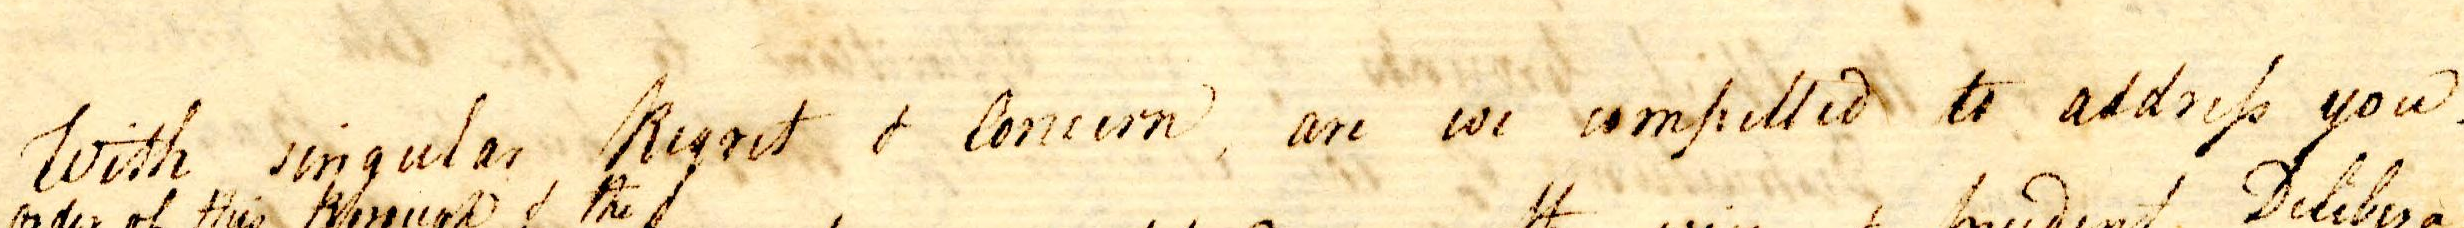With singular Regret & Concern, are we compelled to address you.
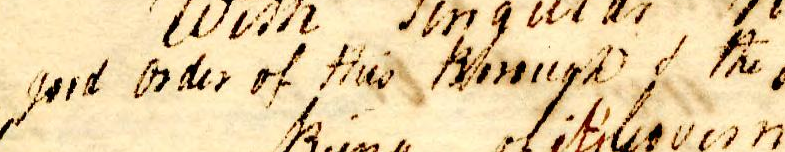good order of this Borough & the
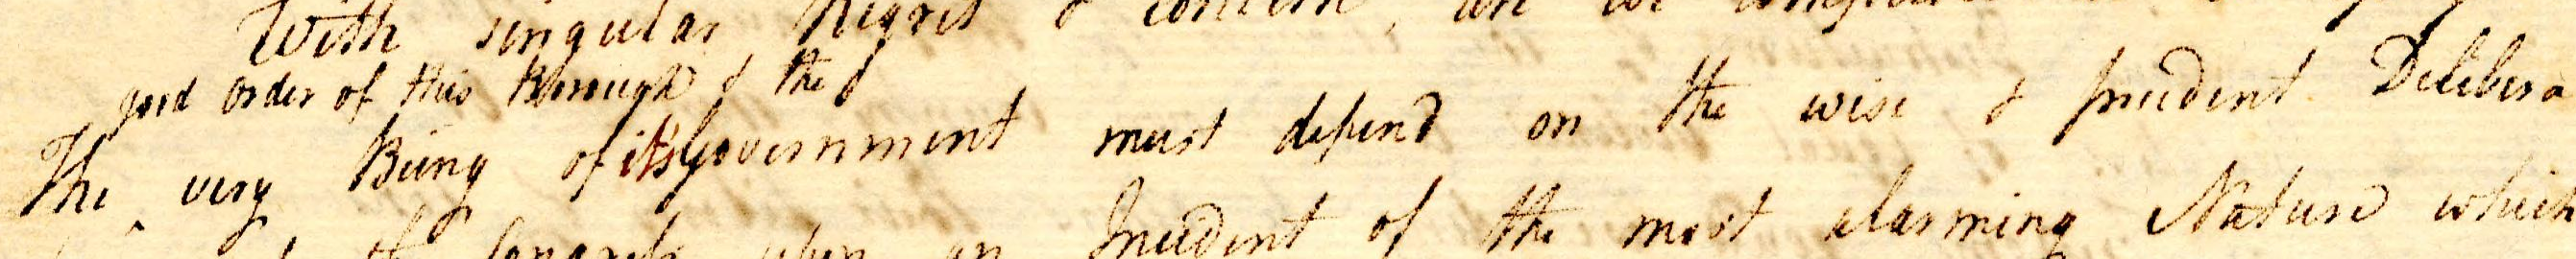The ^ very Being of its Government must depend on the wise & prudent Delibera-
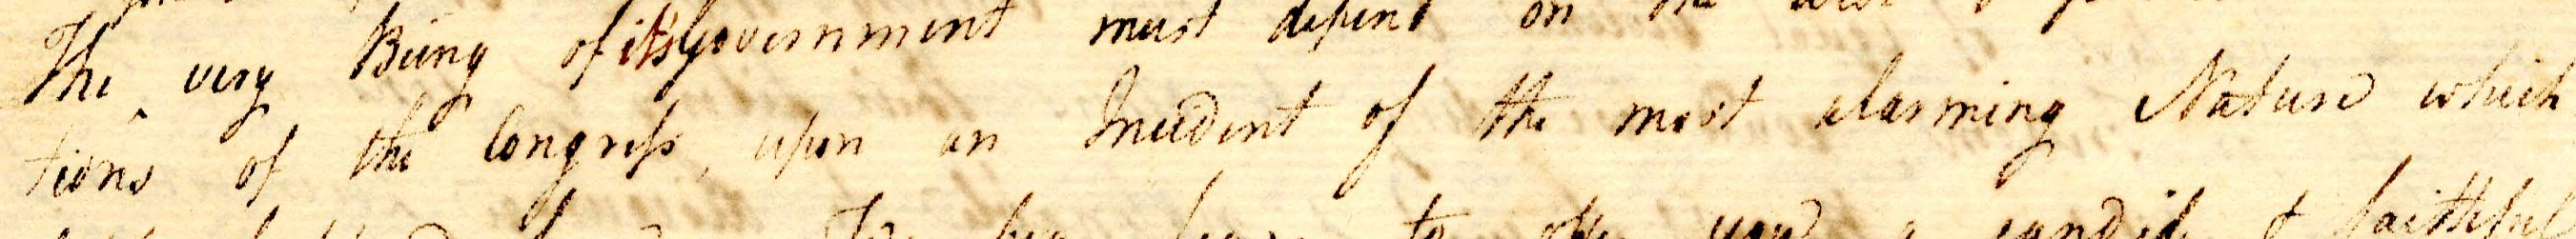-tions of the Congress, upon an Incident of the most alarming Nature which
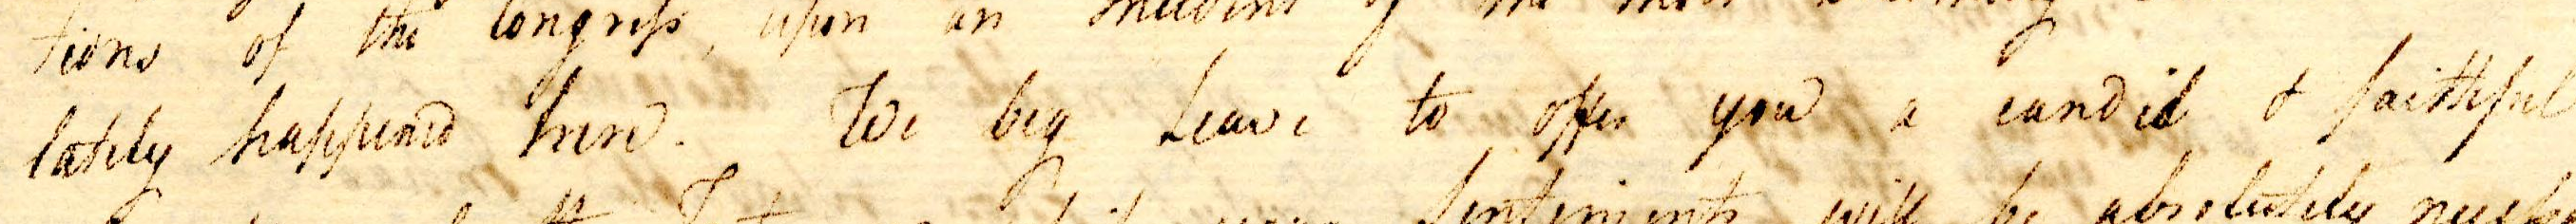lately happened here. We beg Leave to offer you a candid & faithful
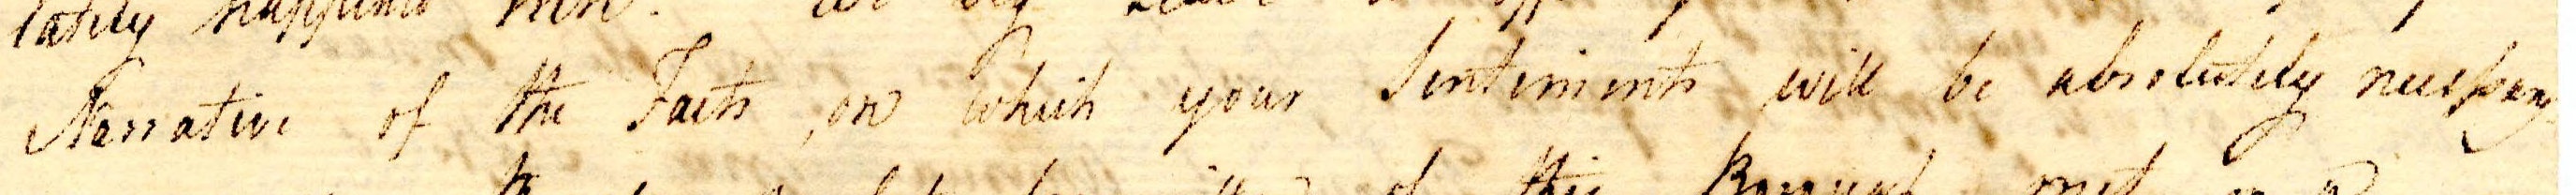Narrative of the Facts on which your Sentiments will be absolutely necessary
